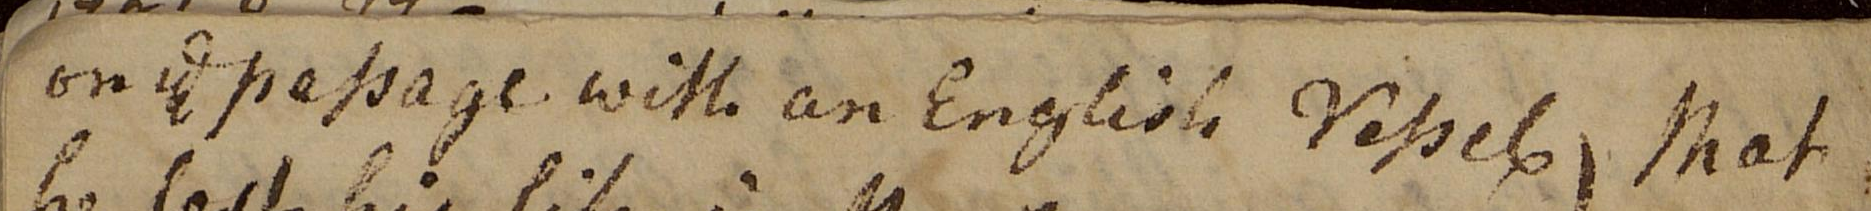on y^e passage with an English Vessel, that
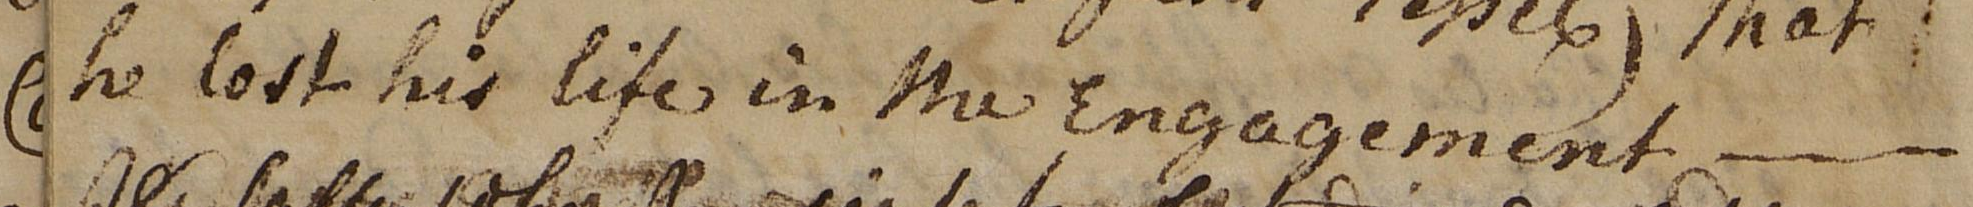he lost his life in the Engagement-
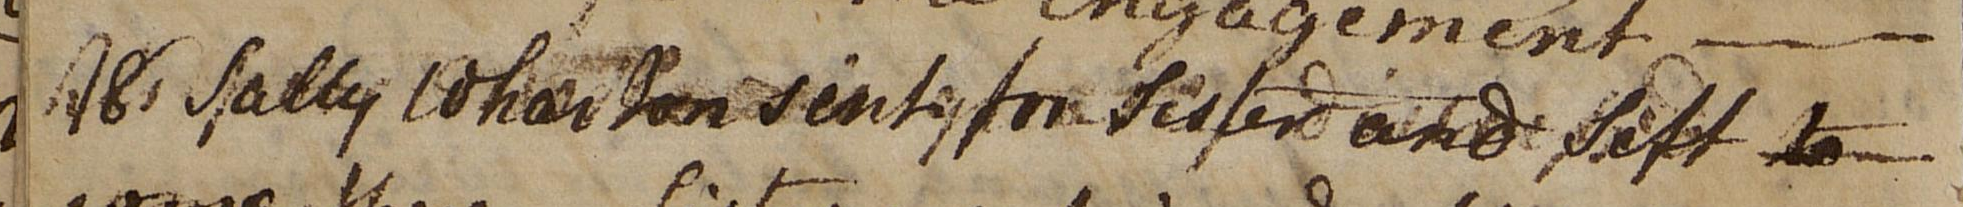18, Sally Wharton sent for Sister and left to
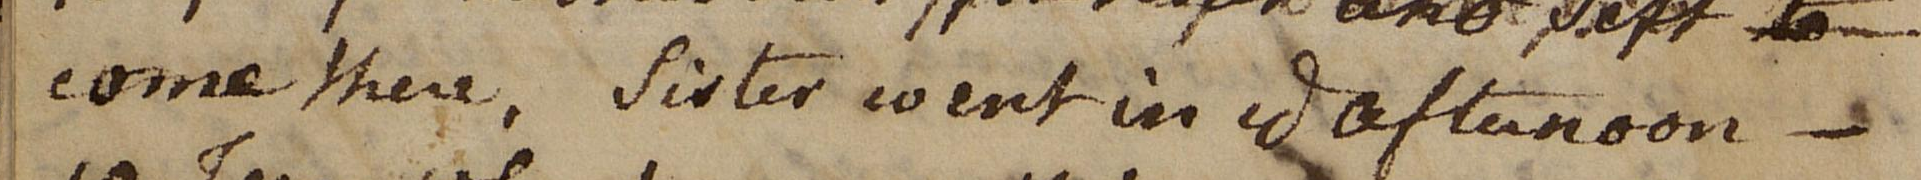come there, Sister went in y^e afternoon-
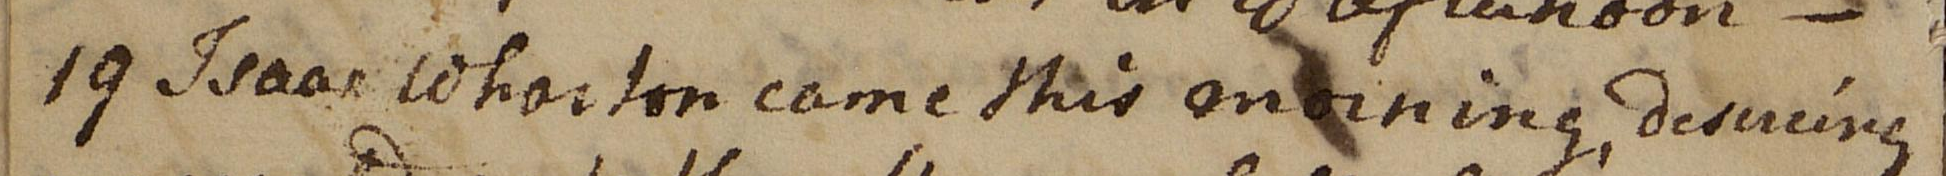19 Isaac Wharton came this morning, desireing
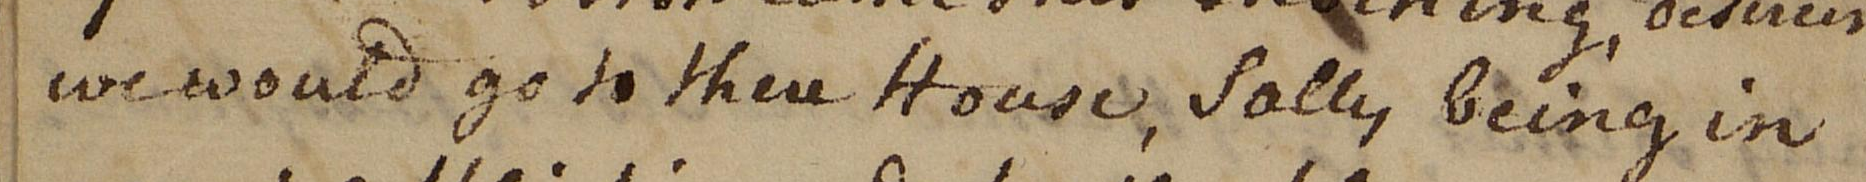we would go to there House, Sally being in
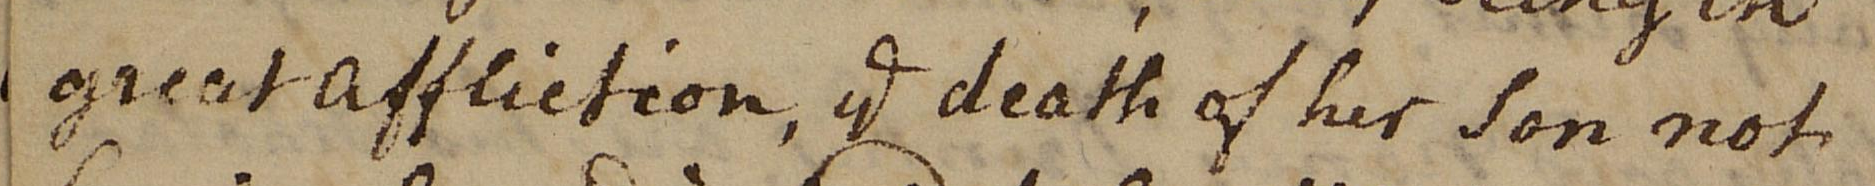great affliction, y^e death of her Son not
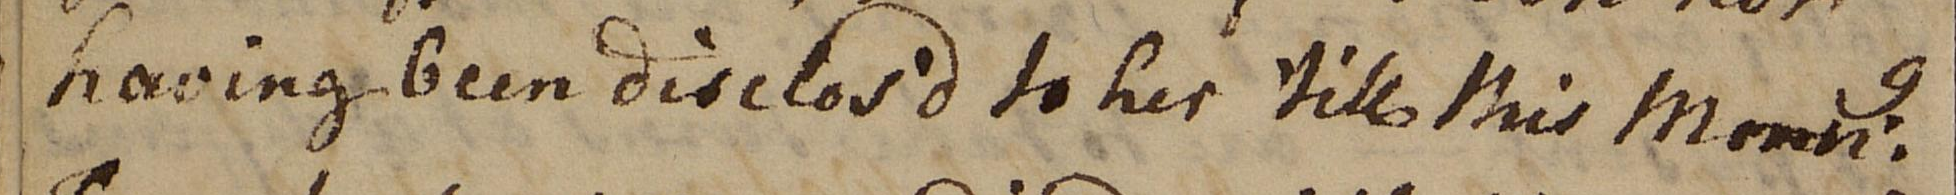having been disclos'd to her till this Morn^g.
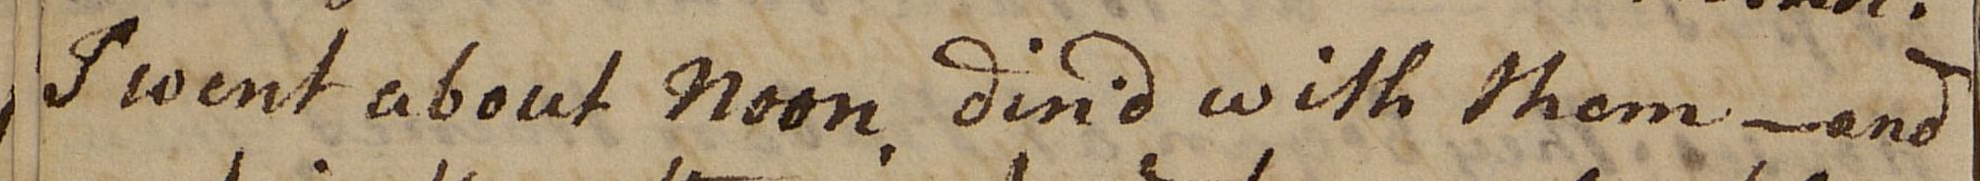I went about noon din'd with them- and
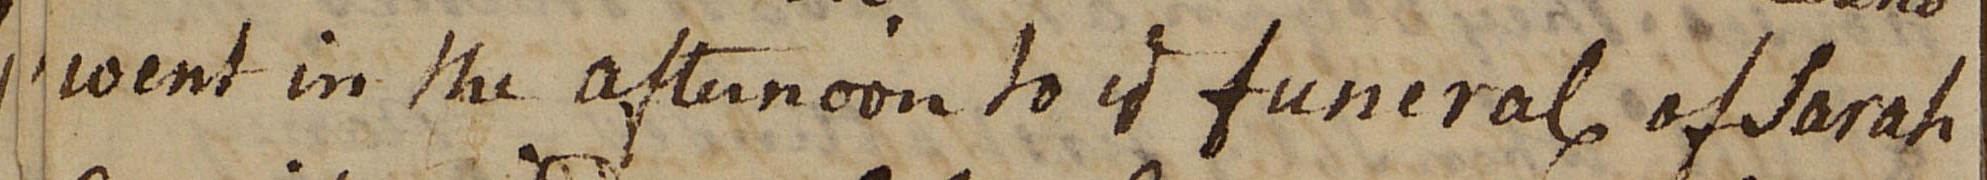went in the afternoon to y^e funeral of Sarah
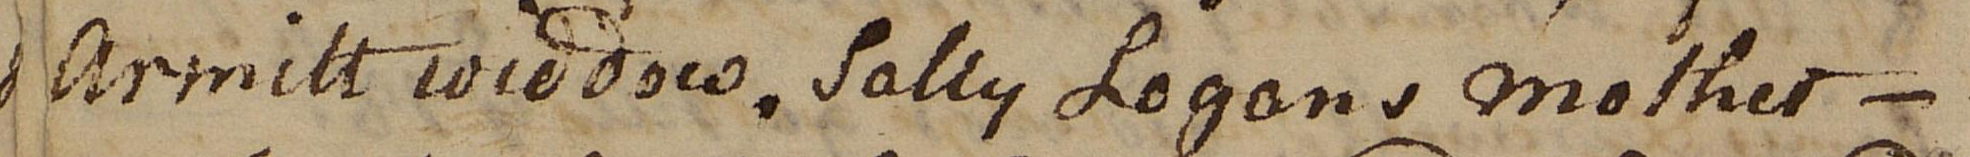Armitt widdow. Sally Logans mother-
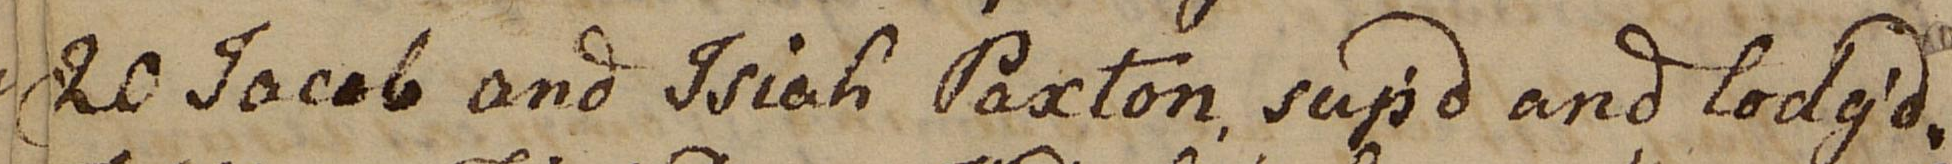20 Jacob and Isiah Paxton, sup'd and lodg'd
